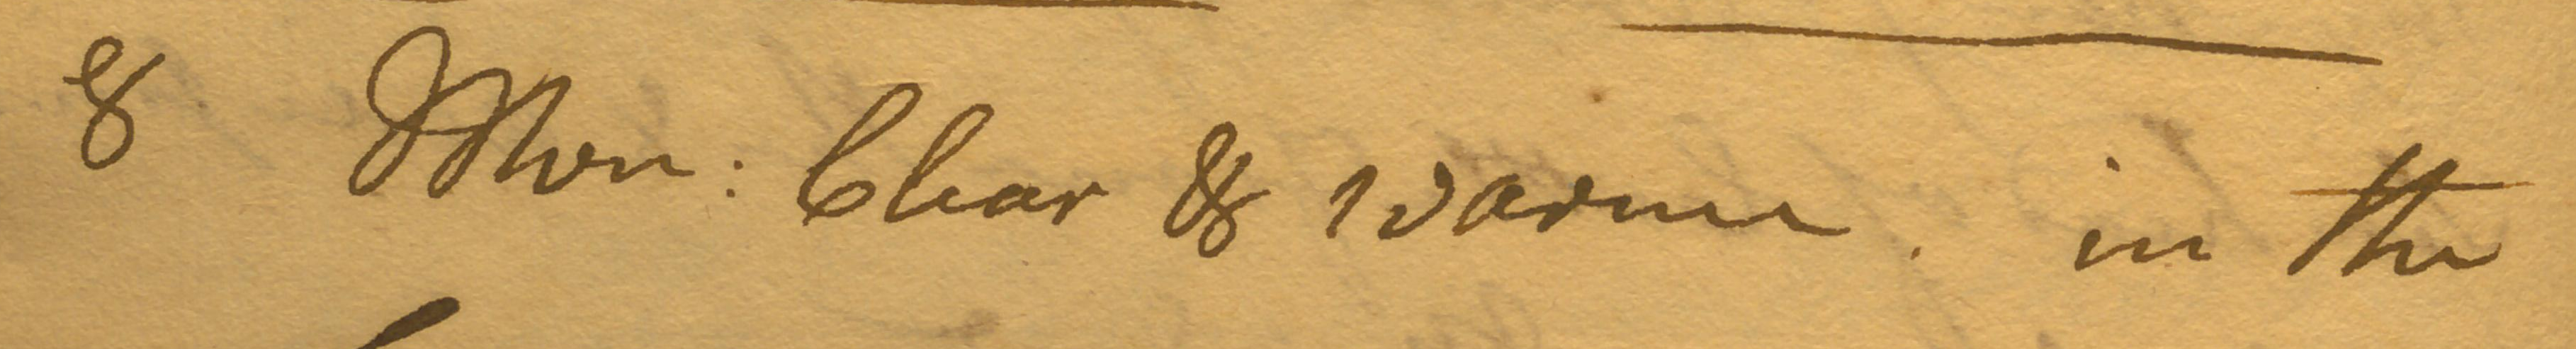8 Mon: Clear & warme. in the
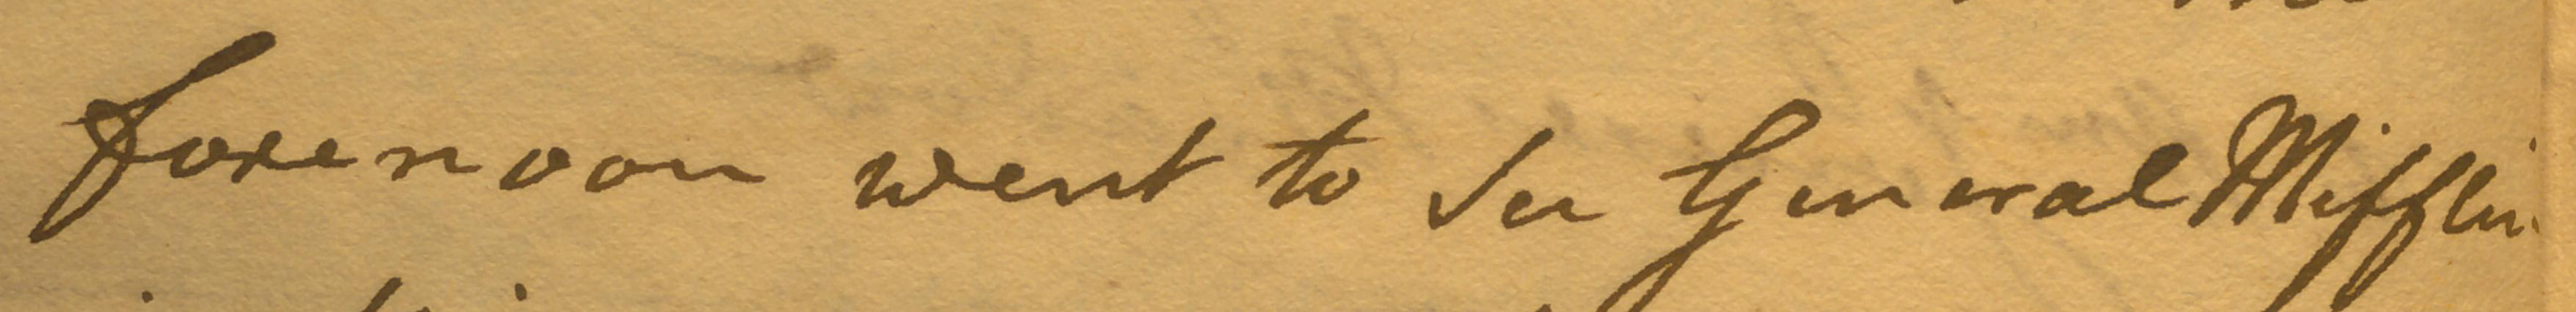forenoon went to see General Mifflin
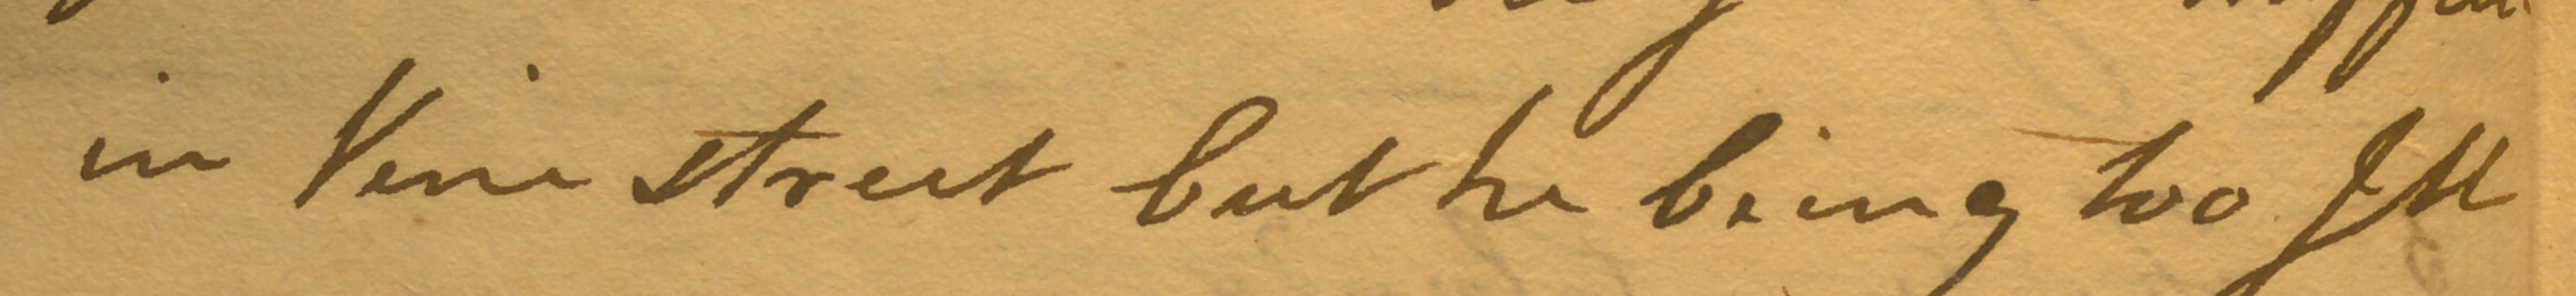in Vine street but he being to Ill
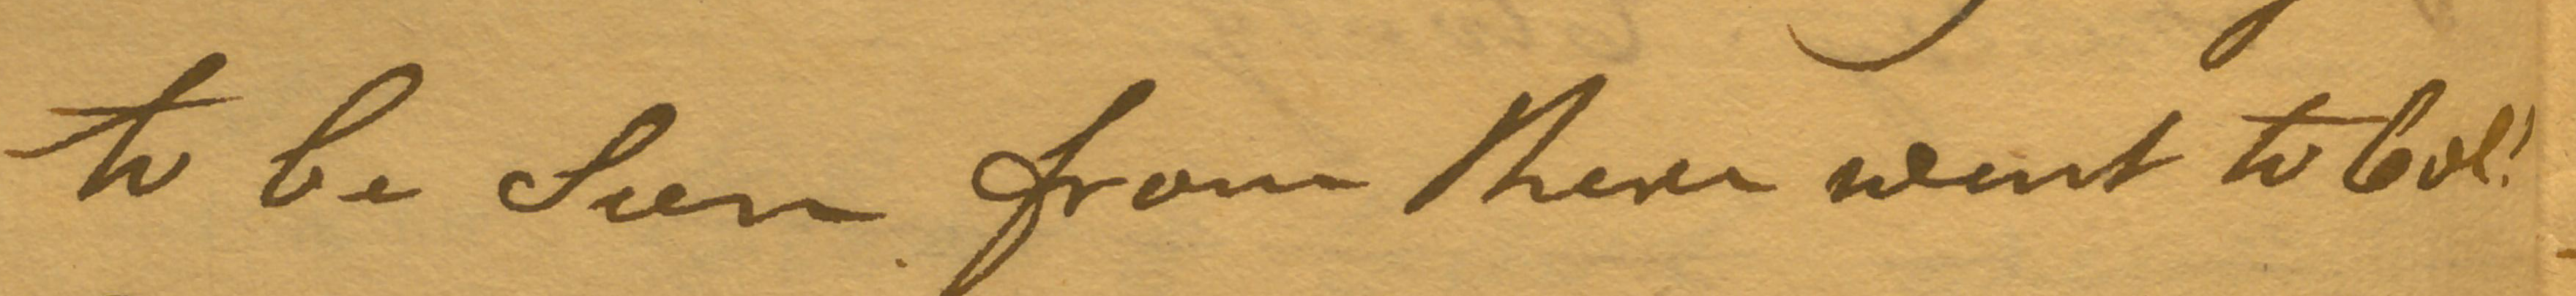to be seen from there went to Col.
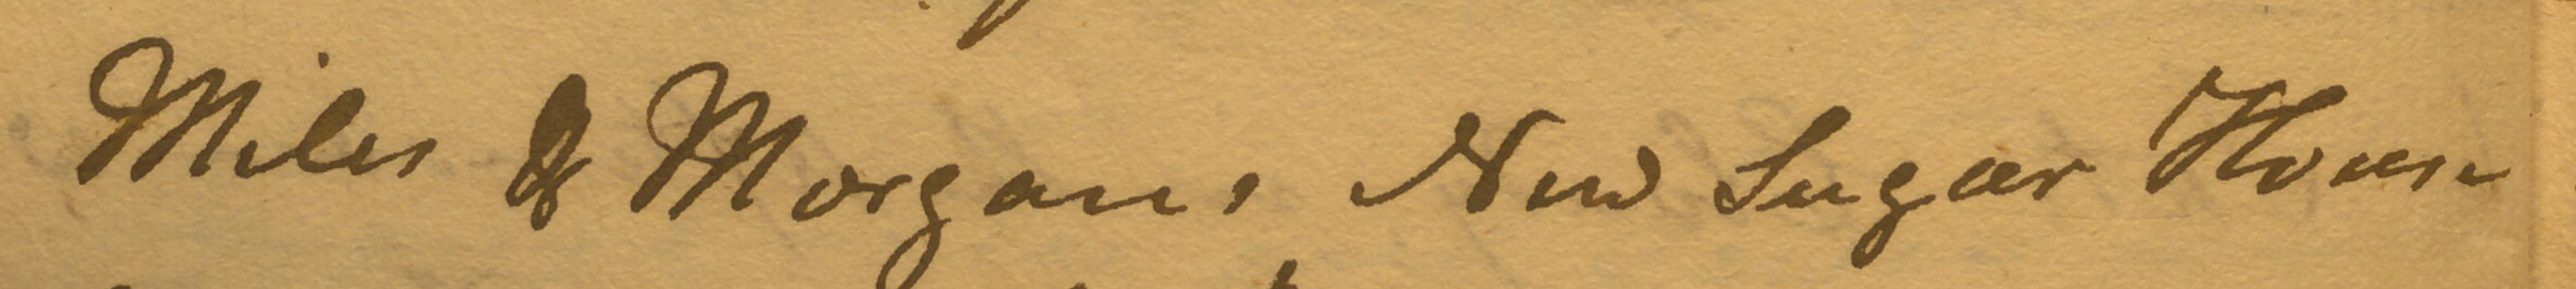Miles & Morgans New Sugar House
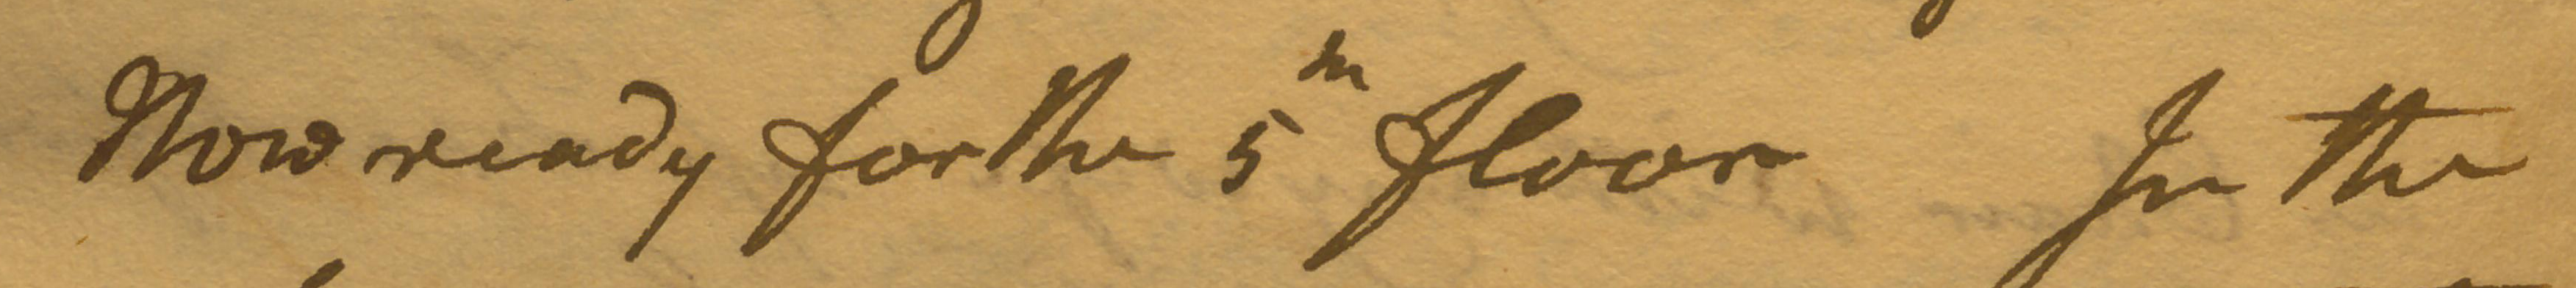Now ready for the 5^th floor In the
